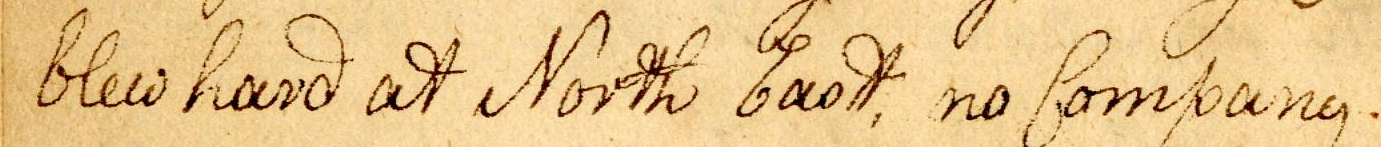blew hard at North East, no Company.
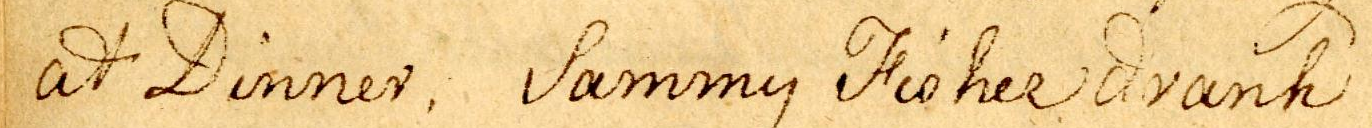at Dinner, Sammy Fisher drank
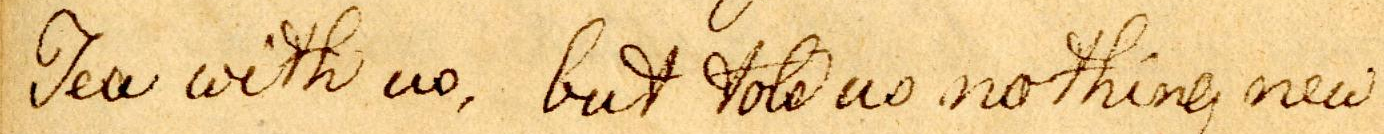Tea with us, but told us nothing new
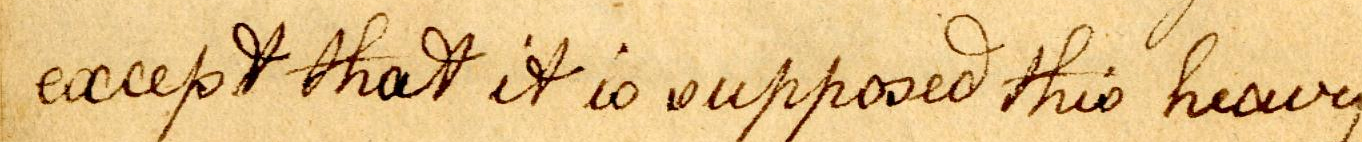except that it is supposed this heavy
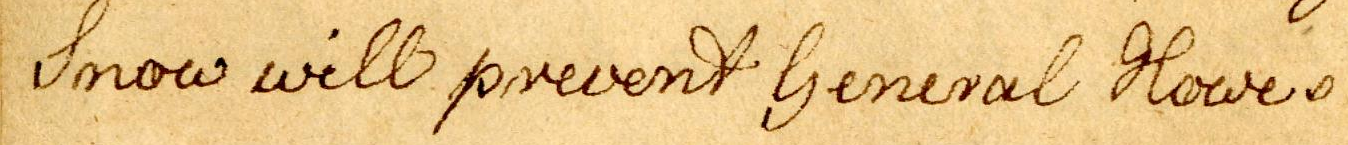Snow will prevent General Howe's
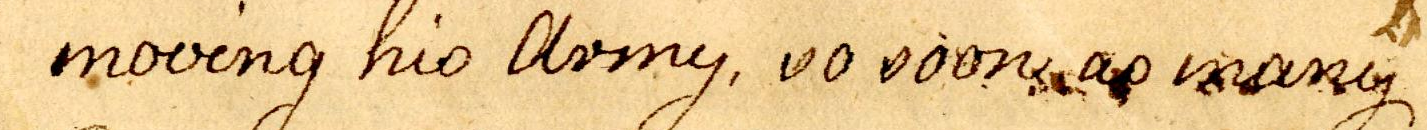moving his Army, so soon as many
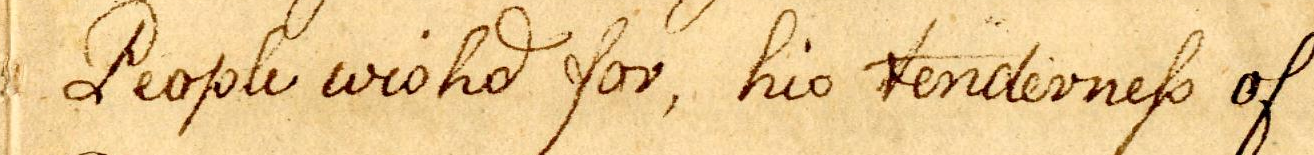People wishd for, his tenderness of
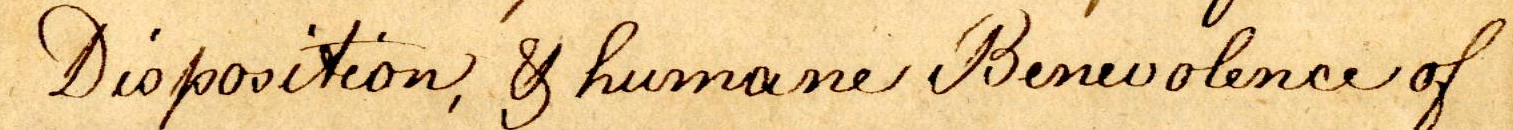Disposition, & humane Benevolence of
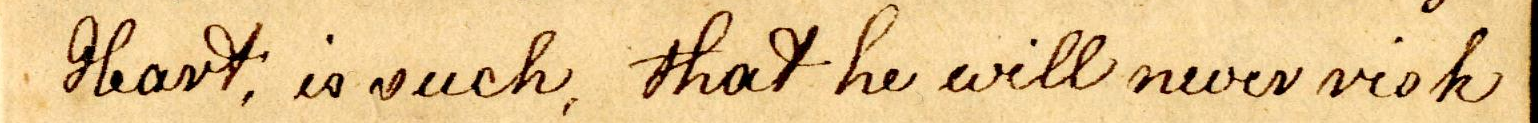Heart, is such, that he will never risk
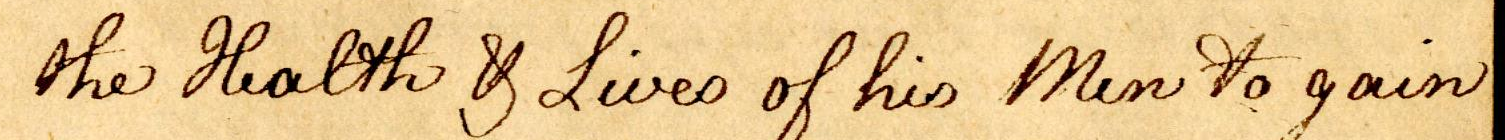the Health & Lives of his Men to gain
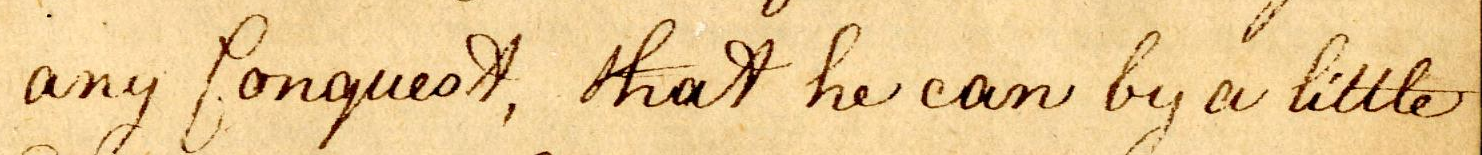any Conquest, that he can by a little
